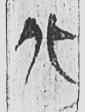北
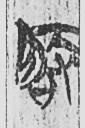啟
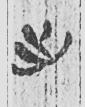出
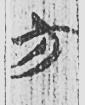方
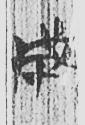成
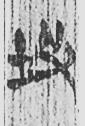圾
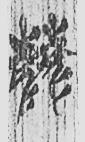{艸㣇㣇}
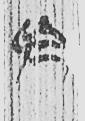於
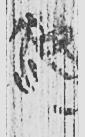汝
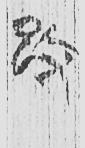改
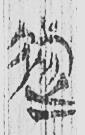{辶旅}
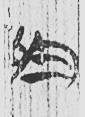於
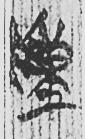陳
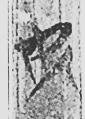𡚦
